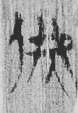安
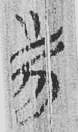廌（存）
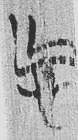忘（亡）
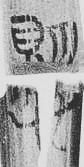惻（賊）
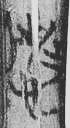○（盜）
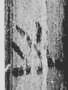之
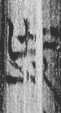拃（作）
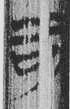可
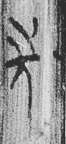之〈先〉
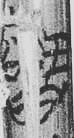智（知）
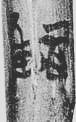○（聞）
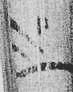之
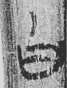曰
